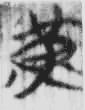黃
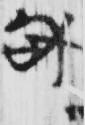和
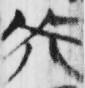癸
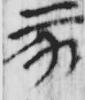亥
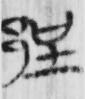郢
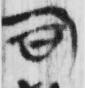司
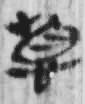惪
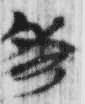秀
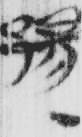{子昜}（陽）
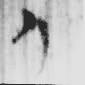人
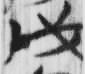戊
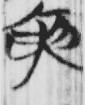寅
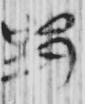郢
